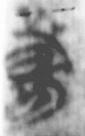○（陽）
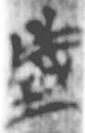城
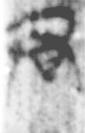君
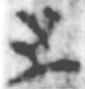之
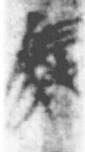駟
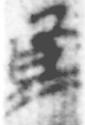爲
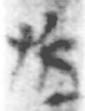○（左）
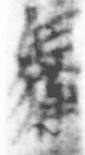○（服）
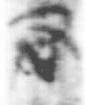君
